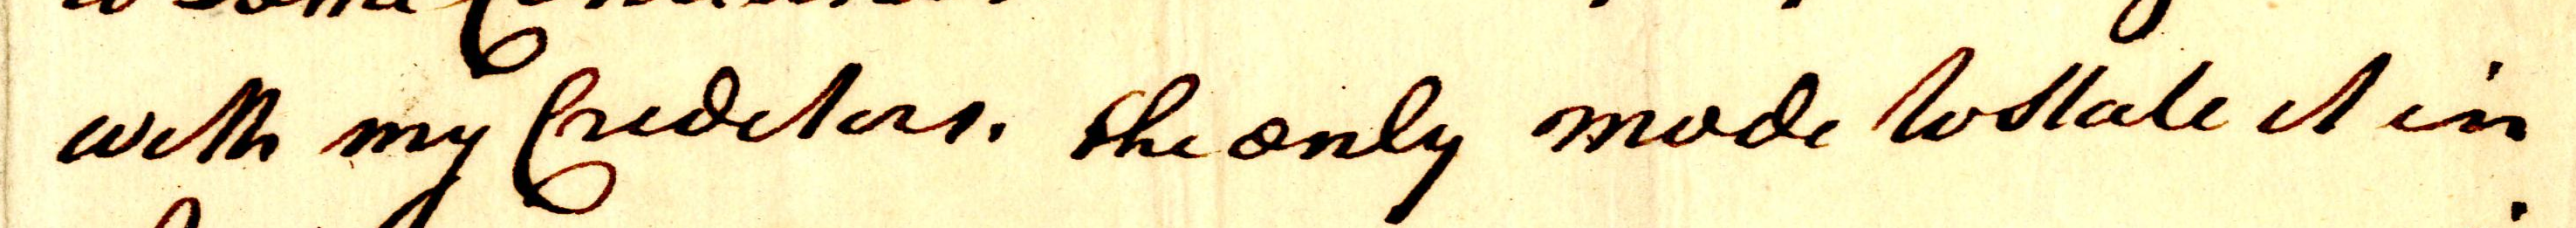with my Creditors. the only mode to state it in
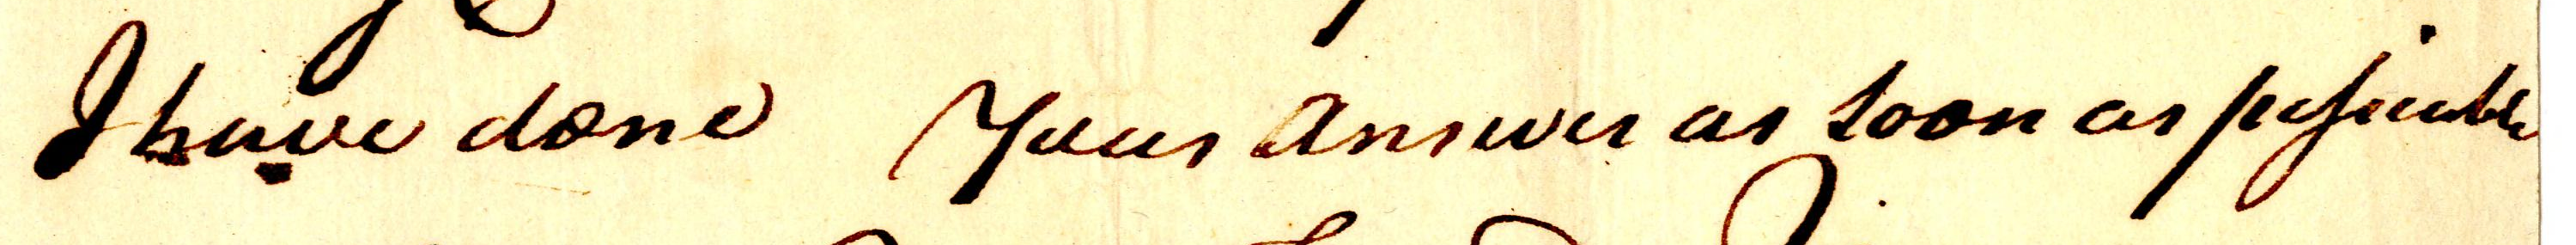I have done. Your answer as soon as possible
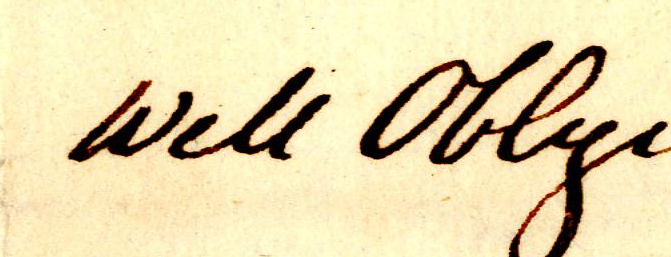will Oblge
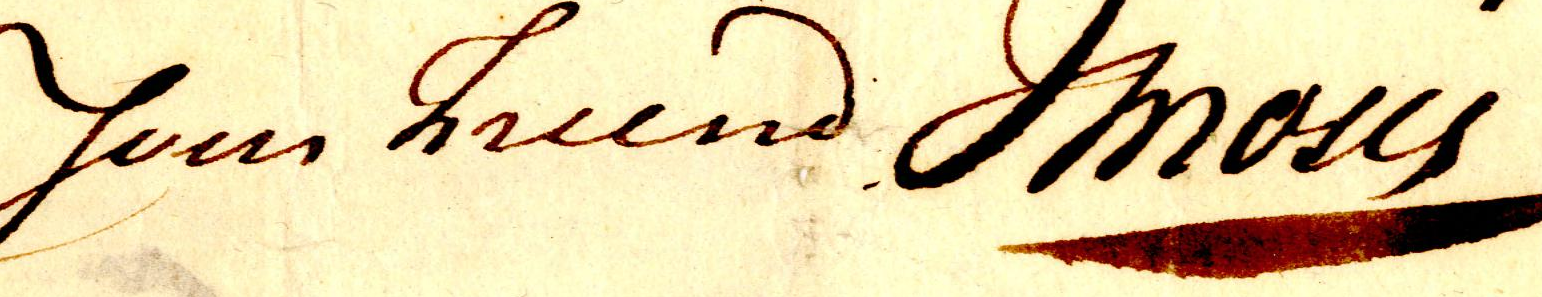Your Friend I Moses
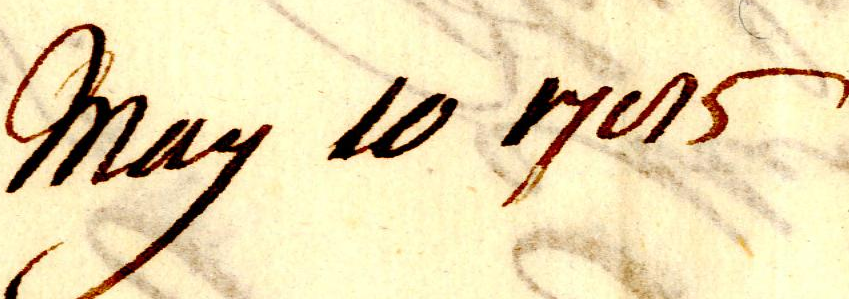May 10 1795
